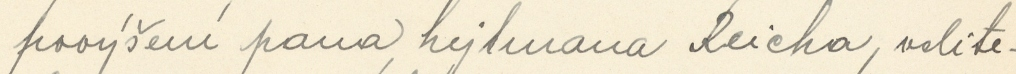povýšení pana hejtmana Reicha, velite-
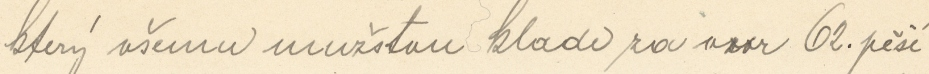který všemu mužstvu klade za vzor 62. pěší
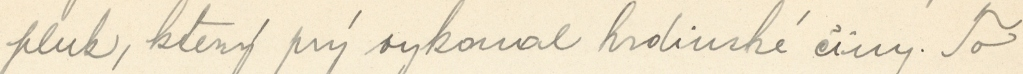pluk, který prý vykonal hrdinské činy. To
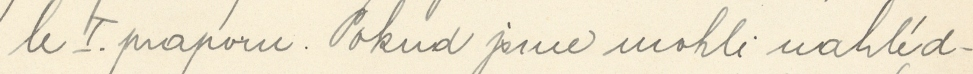le I. praporu. Pokud jsme mohli nahléd-
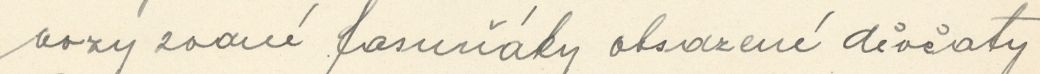vozy zvané fasuňáky obsazené děvčaty.
